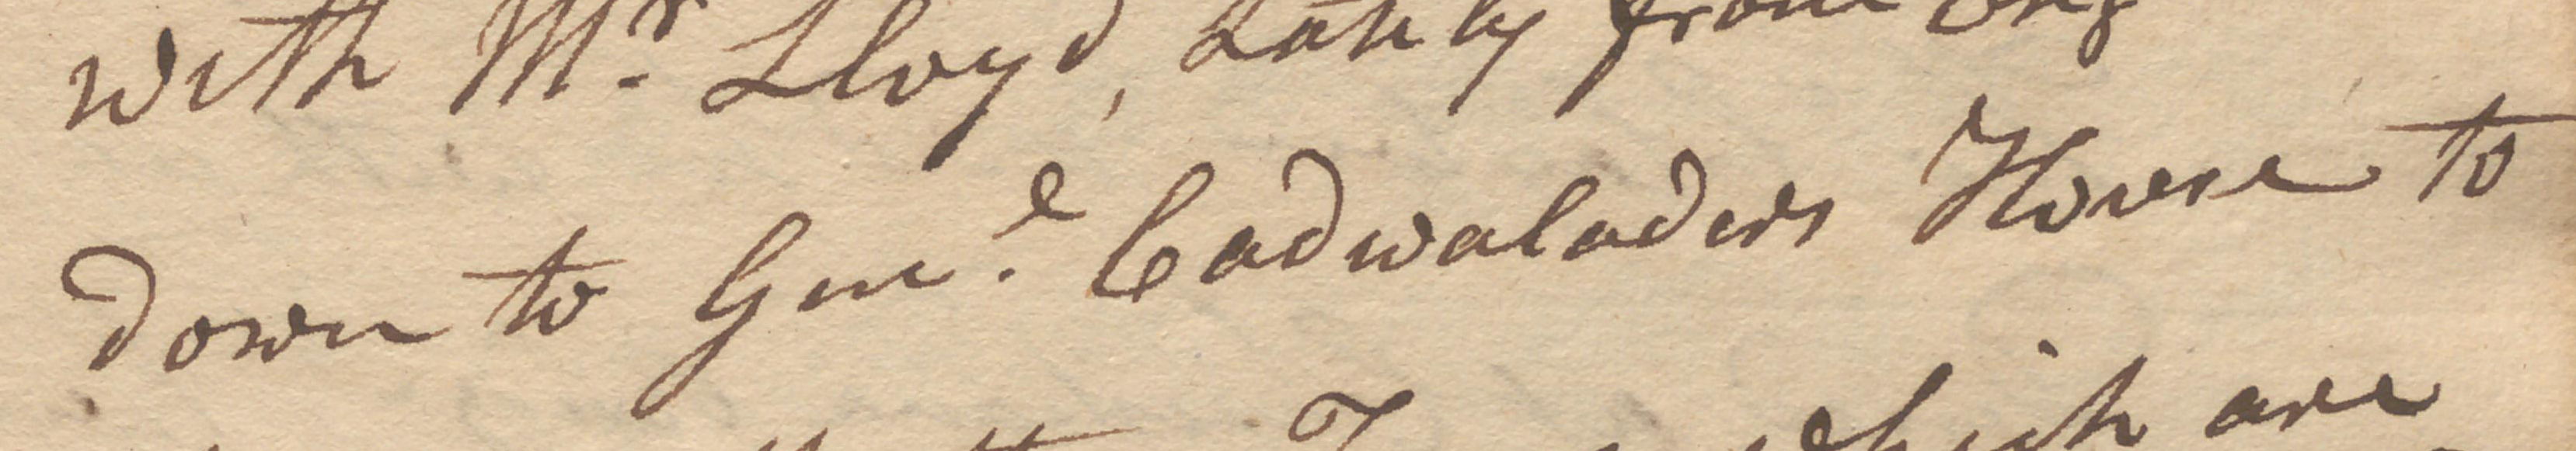down to Gen^l. Cadwaladers House to
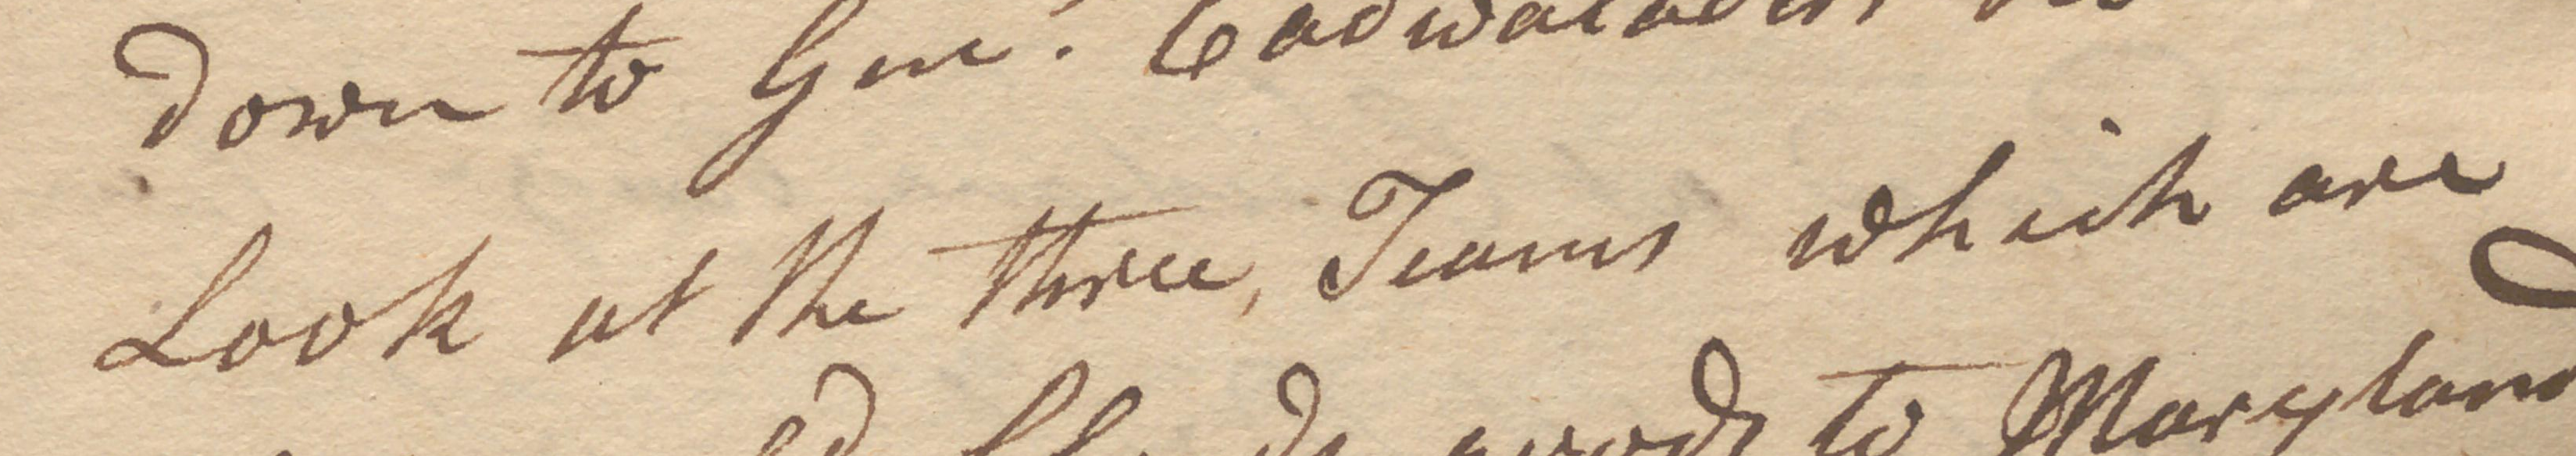Look at the three, Teams which are
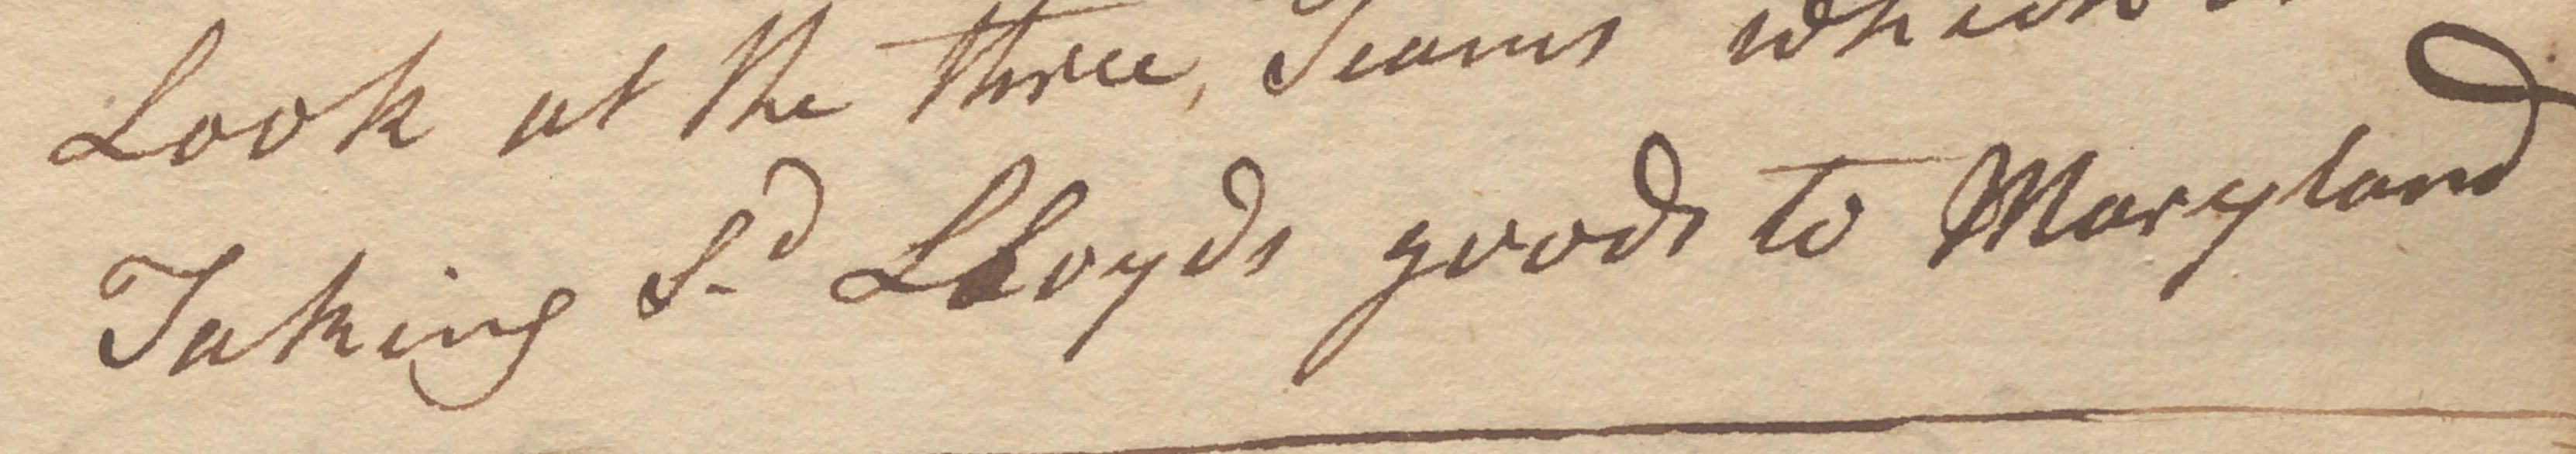Taking s^d. Lloyds goods to Maryland
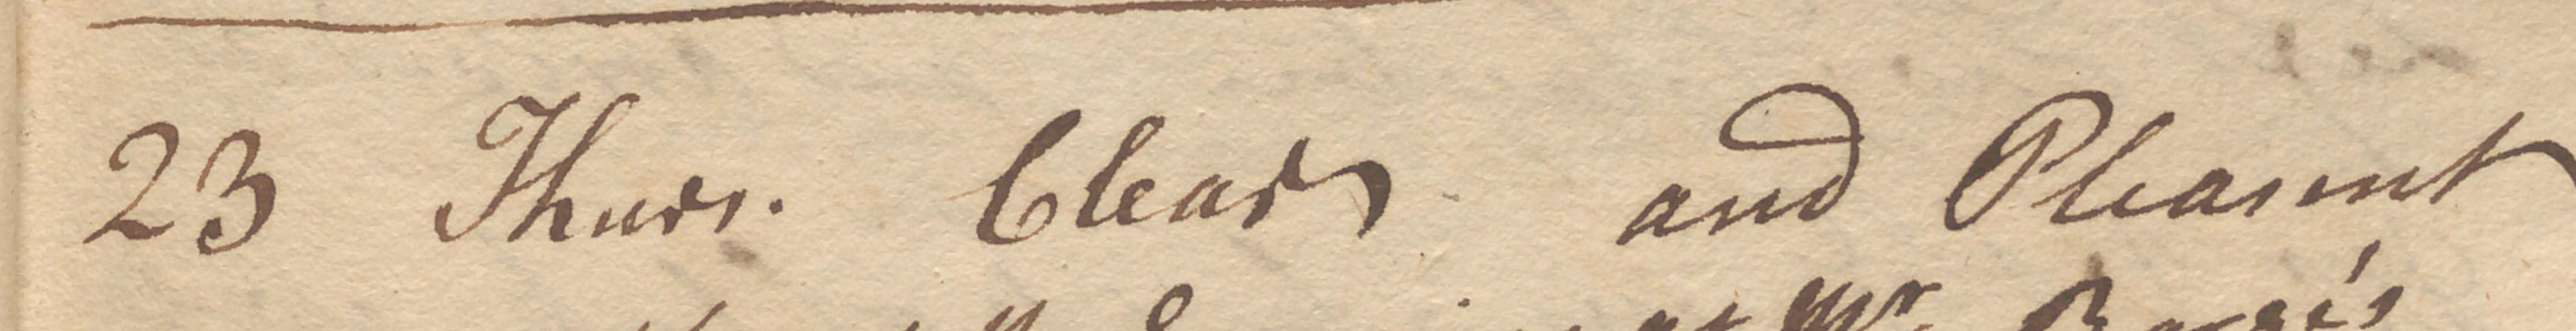23 Thurs. Clear and Pleasent
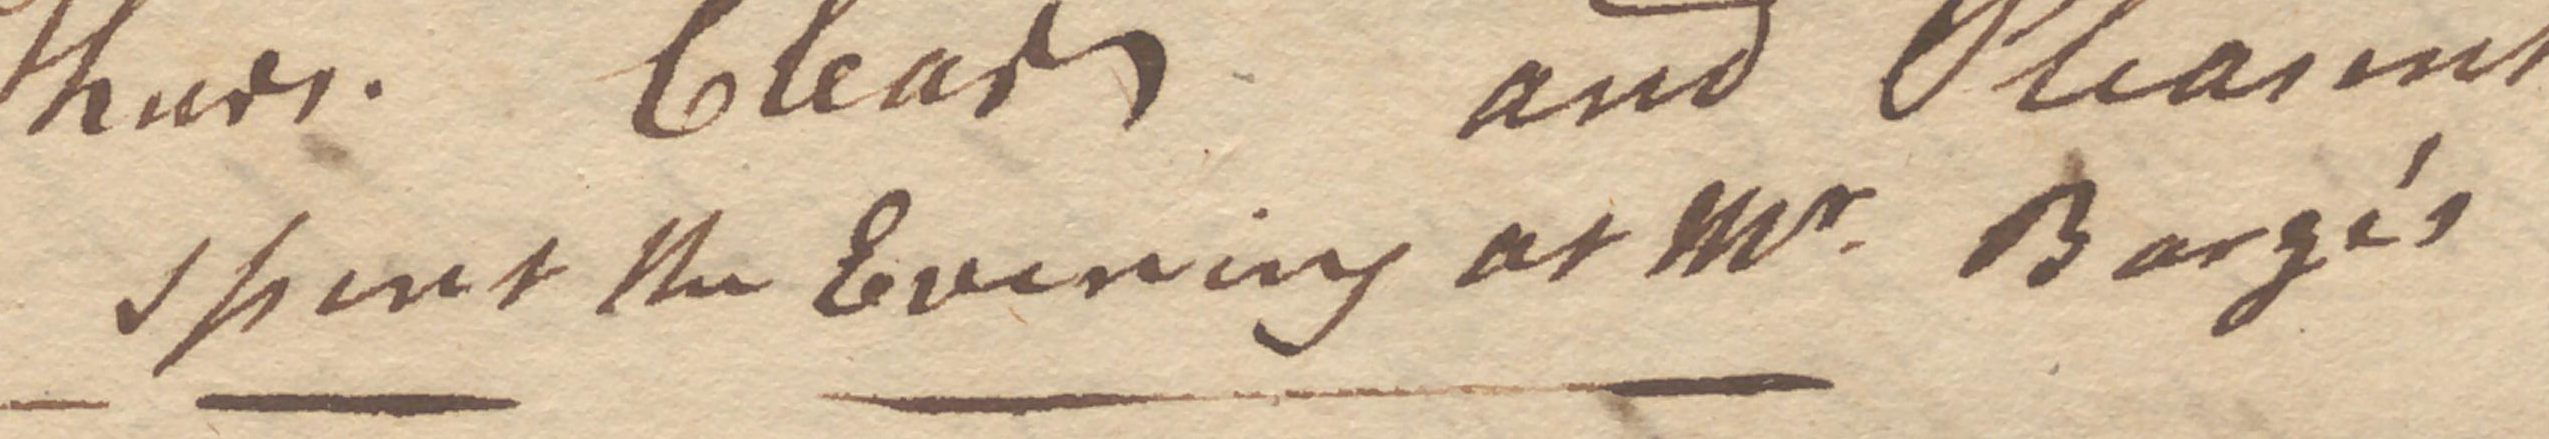spent the Evening at M^r. Barge's
